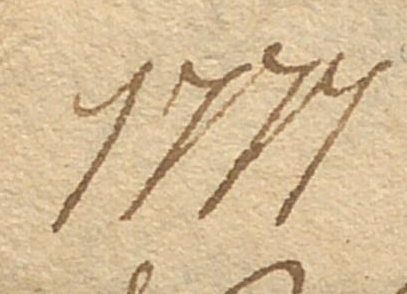1777
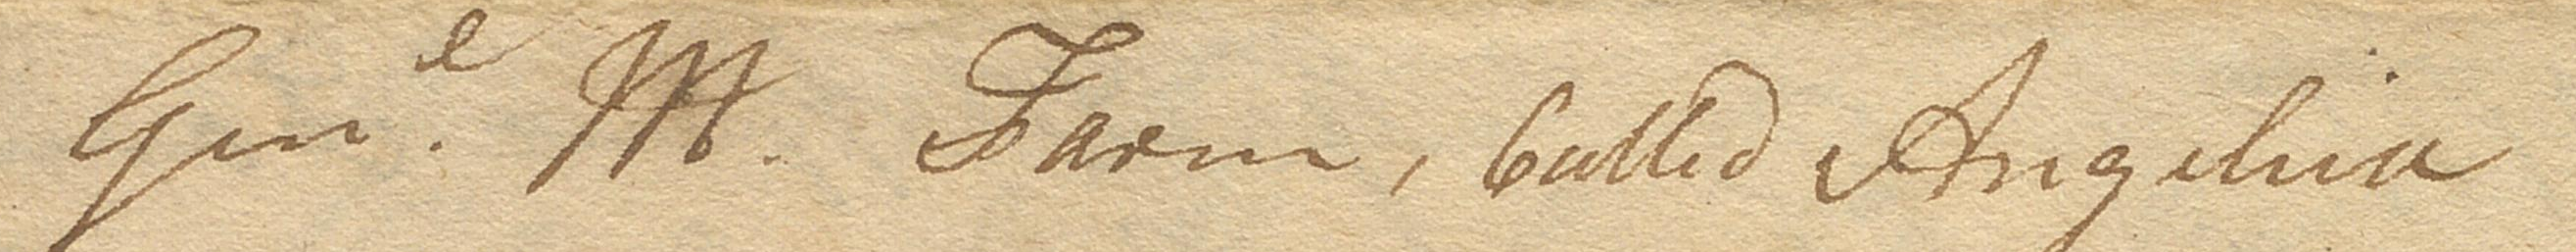Gen^l. M. Farm, Called Angelica
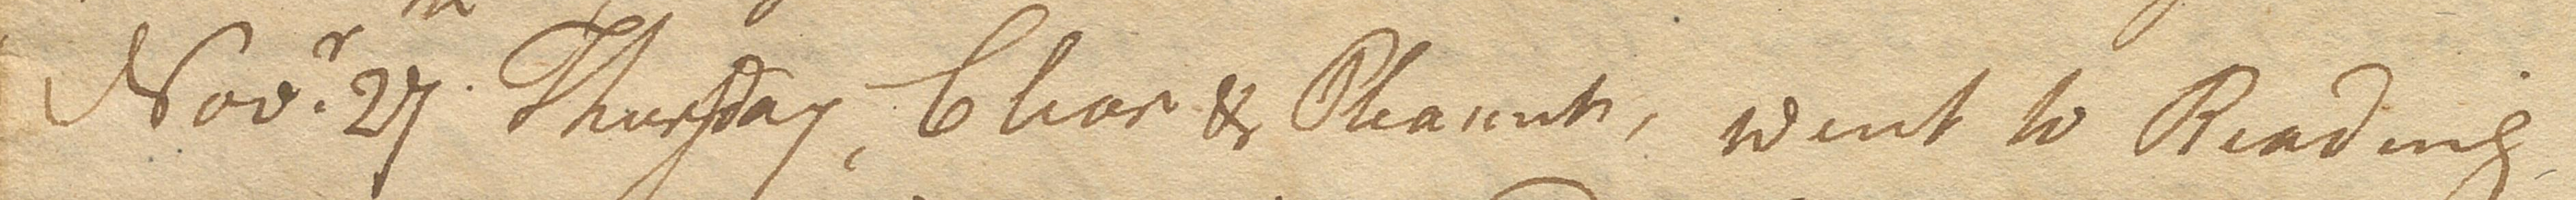Nov^r. 27^th. Thursday Clear & Pleasents, went to Reading
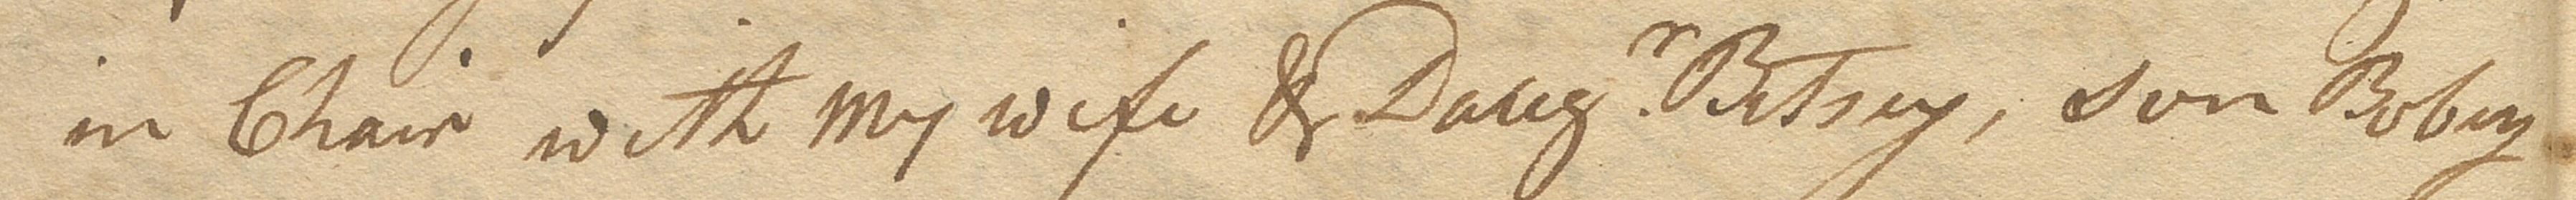in Chair with my wife & Daug^r. Betsey, son Bobey
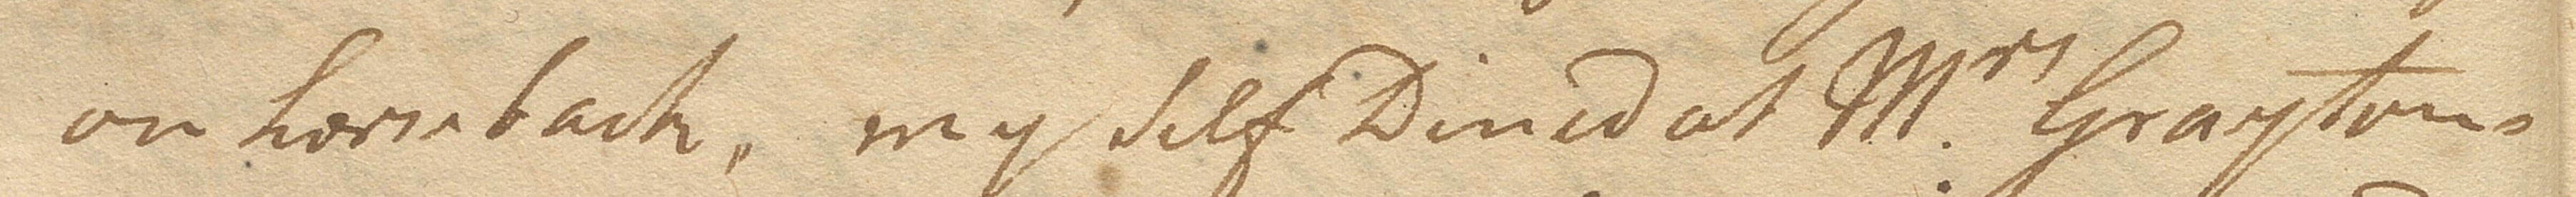on horseback, my self Dined at M^r. Graytons
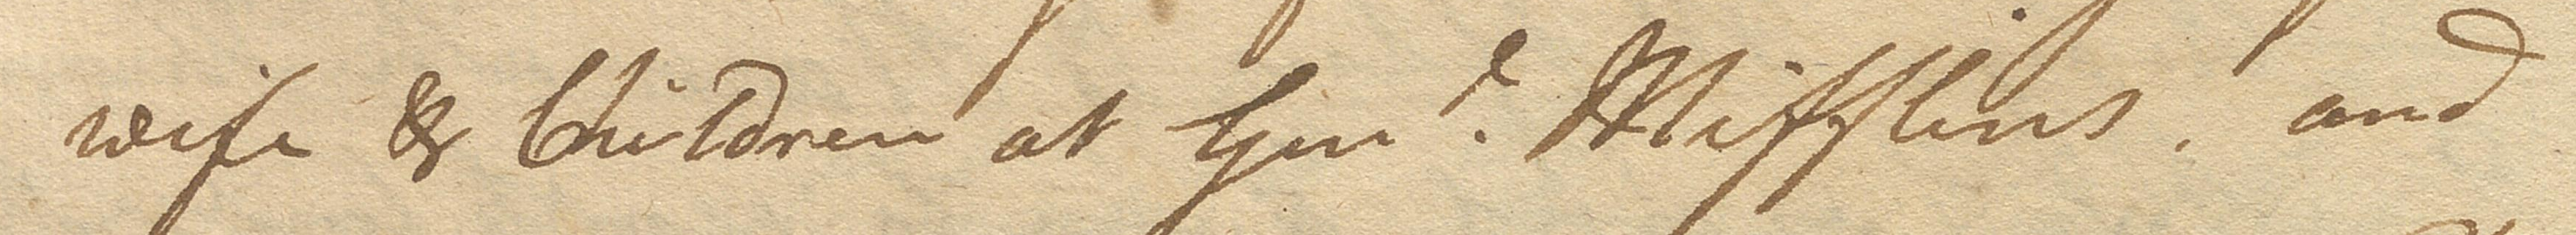wife & Children at Gen^l. Mifflins, and
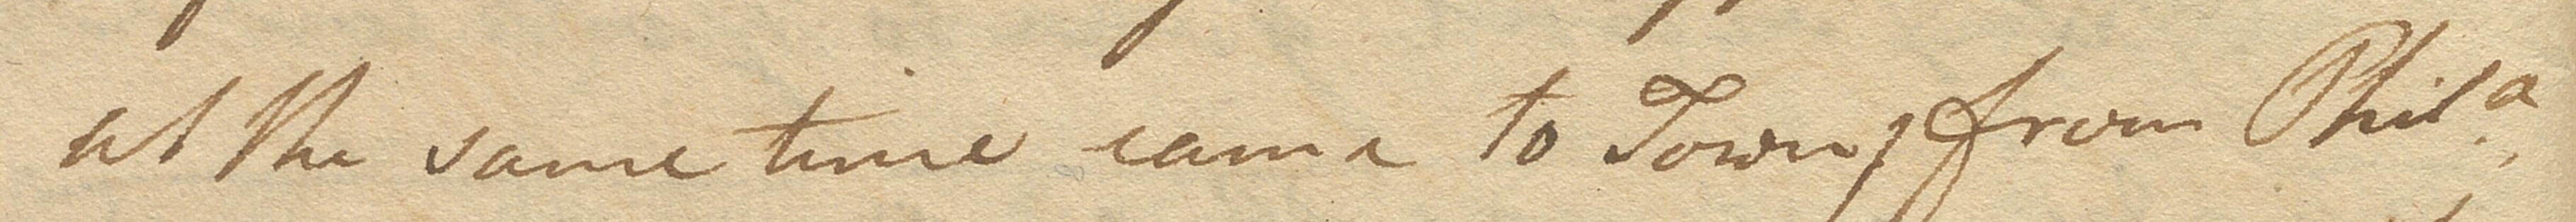at the same time came to Town, from Phil^a
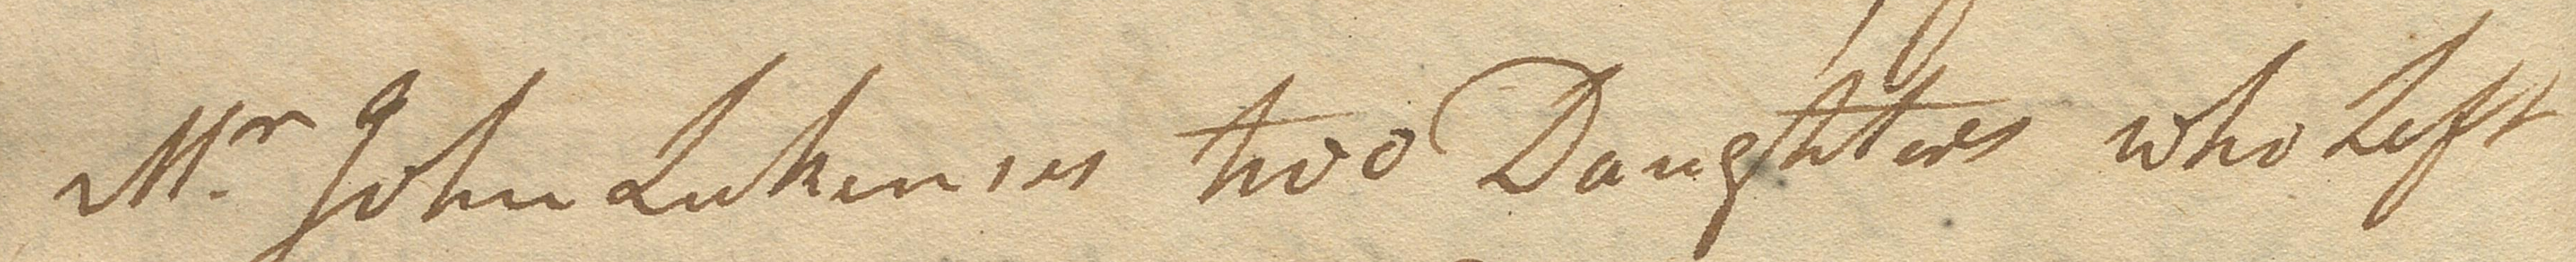M^r. John Lukenses two Daughters who Left
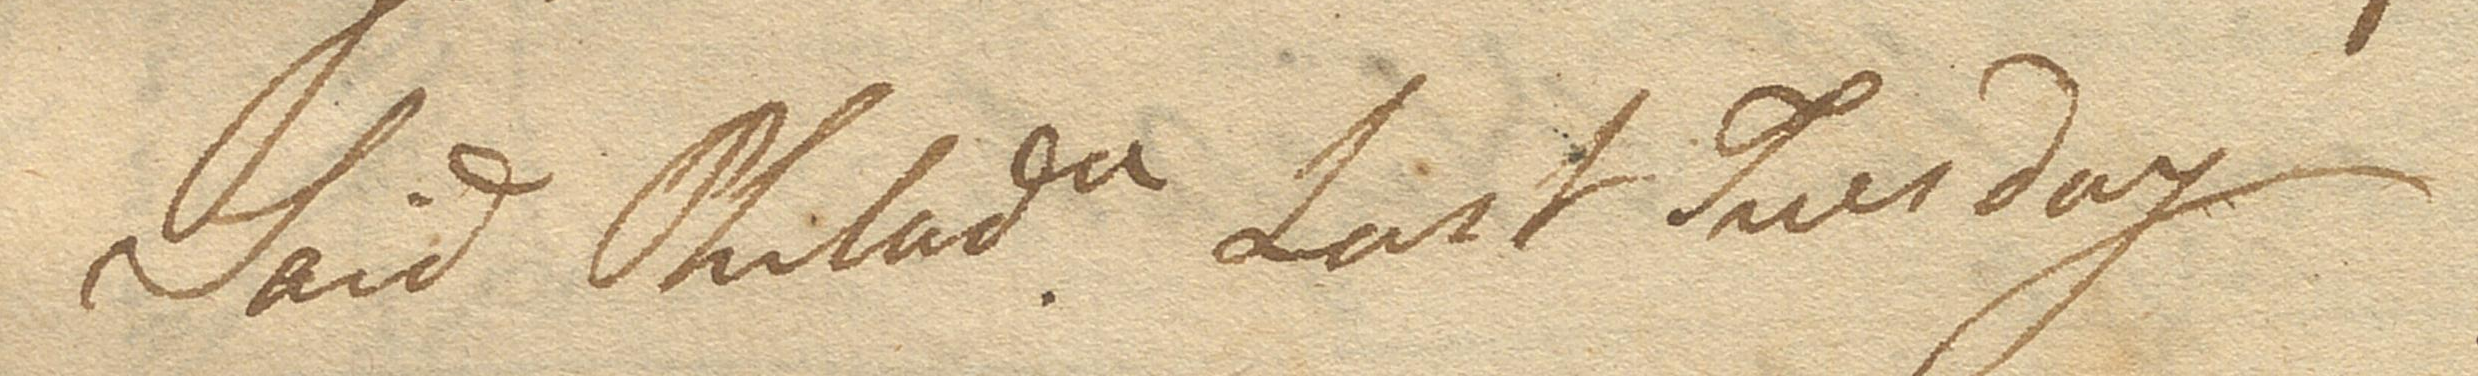said Philad^a. Last Tuesday
